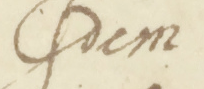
Idem
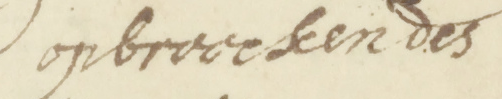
opbreecken des
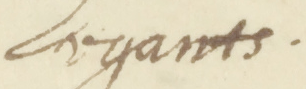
vyants
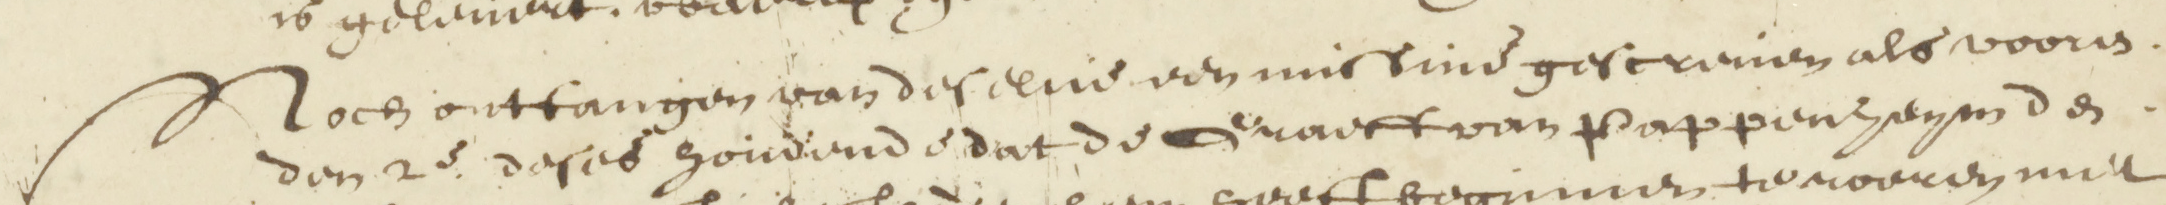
Noch ontfangen van deselue een missiue gescreuen als vooren.
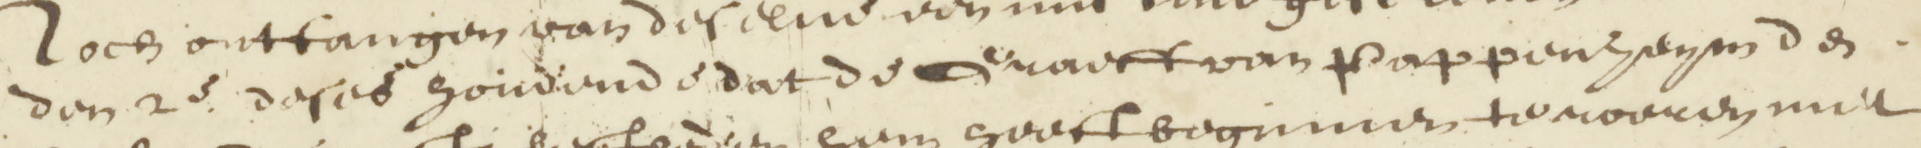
den 2en. deses houdende dat de Graeff van Pappenheym den
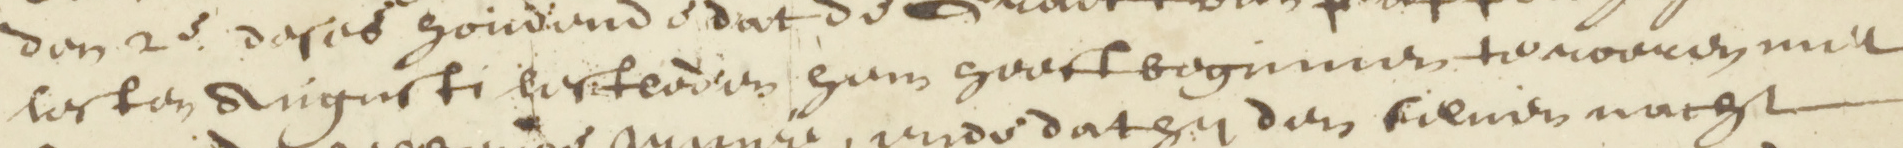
lesten Augusti lestleden hem heeft beginnen te roeren met
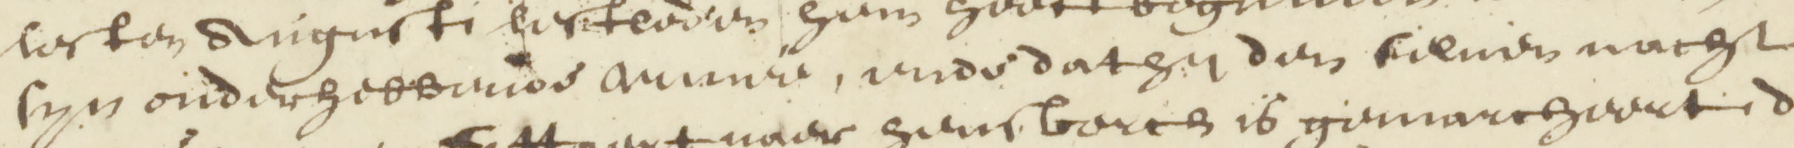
syn onderhebbende Armee, ende dat hy den seluen nacht
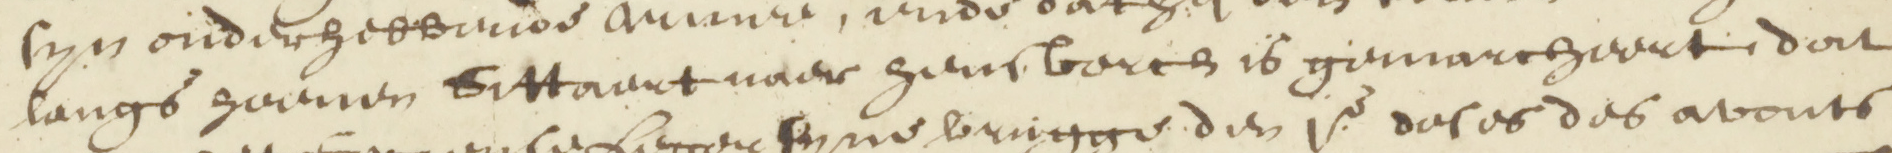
langs heenen Sittaert naer hensberch is gemarcheert, dat
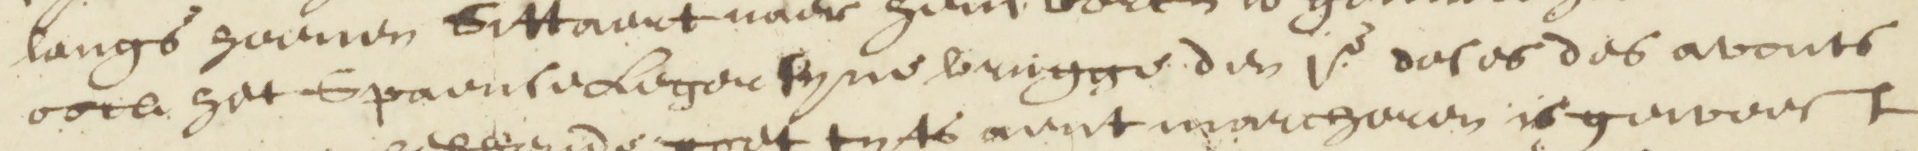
oock het Spaense Leger syne brugge den 1en. deses des avonts
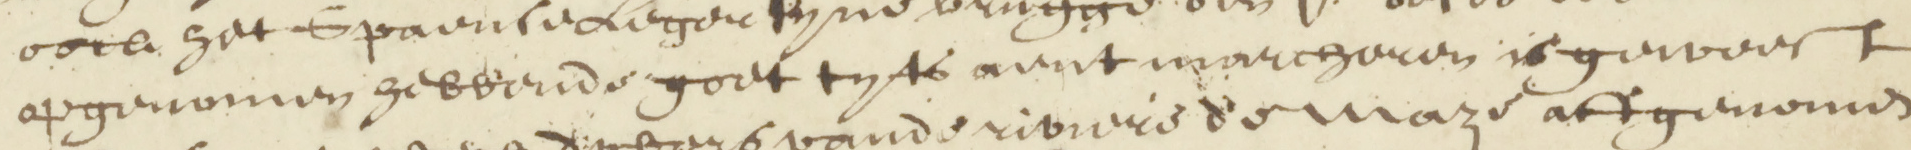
opgenomen hebbende goet tyts aent marcheren is geweest
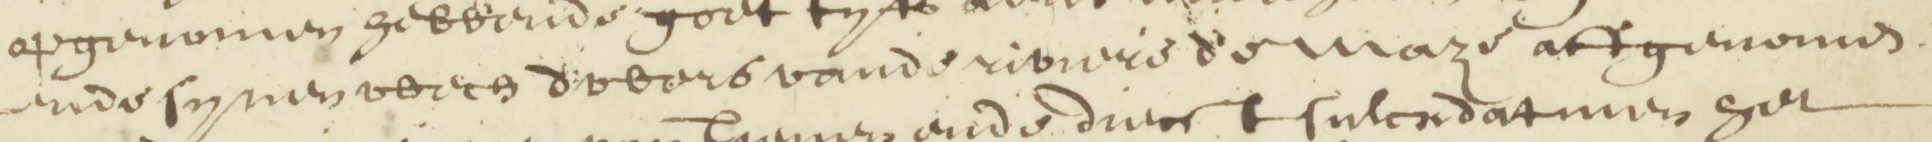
ende synen wech dwers vande riviere de Maze affgenomen
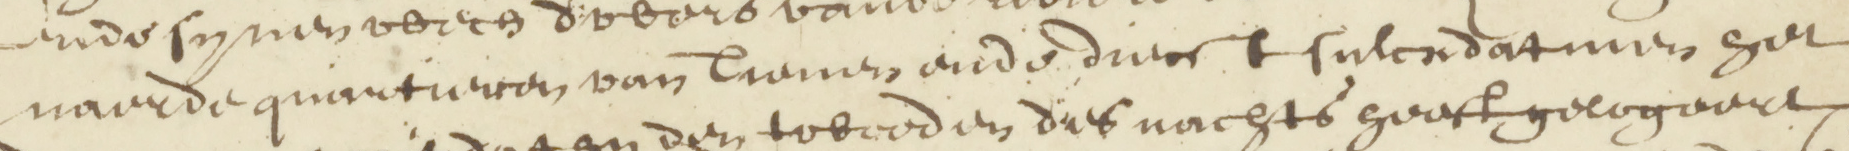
naerde quartieren van Tienen ende diest sulcx datmen het
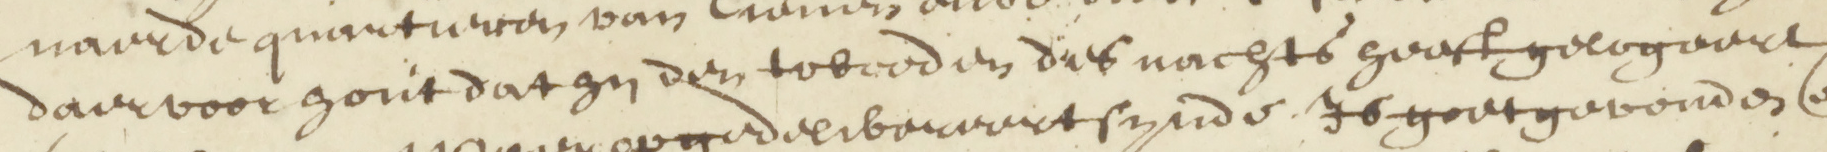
daervoor hout dat hy den tweeden des nachts heeft gelogeert
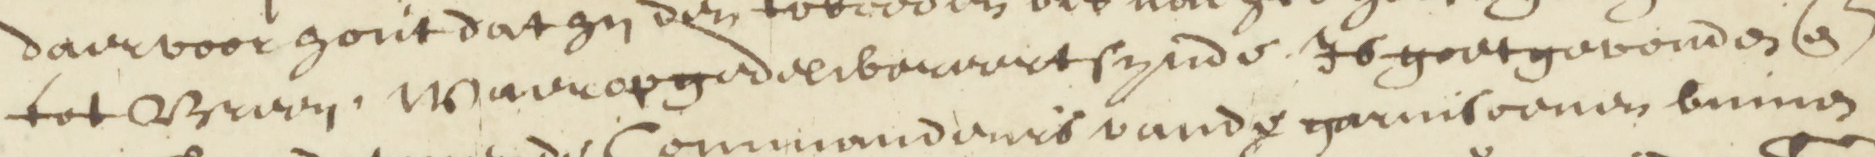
tot Breey. Waerop gedelibereert synde, Is goetgevonden &
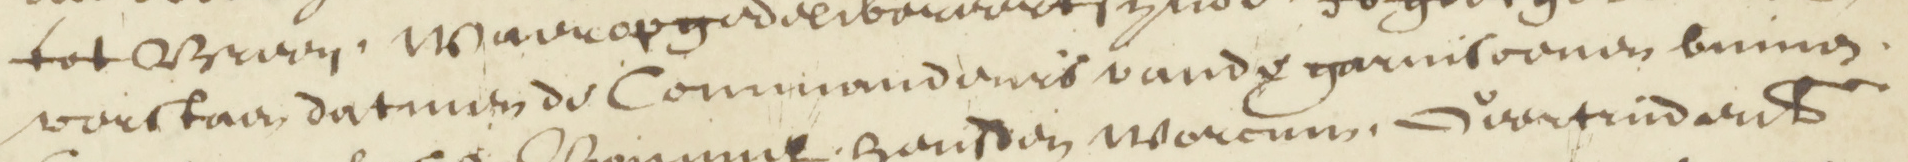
verstaen, datmen de Commandeurs vande garnisoenen binnen.
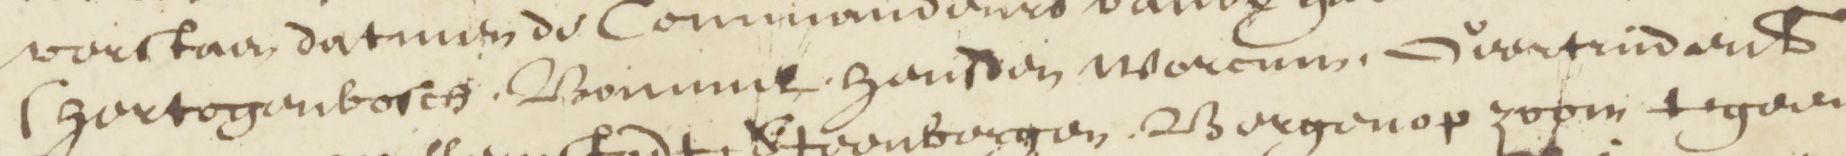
shertogenbosch, Bommel, heusden Worcum, Geertrudenb
